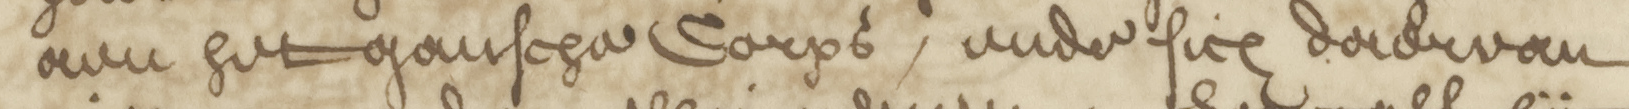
aen het gansche Corps, ende sich daervan
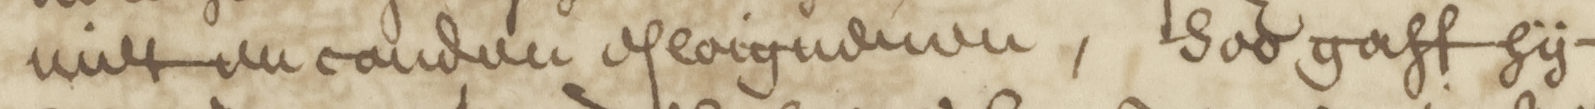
niet en conden esloigneren, soo gaff hij —
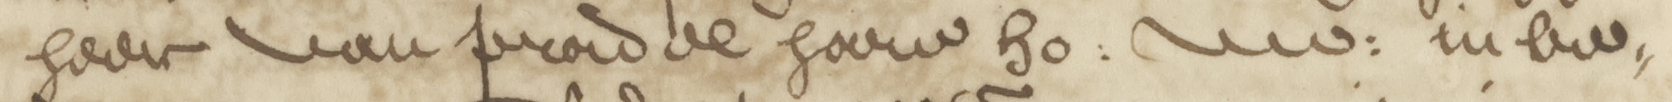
heer van pradel hare ho:Mo: in be,,
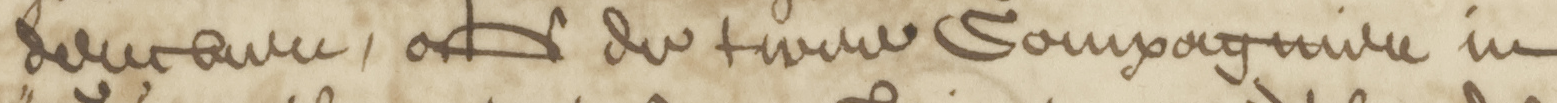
„dencken, off de twee Compagnien in
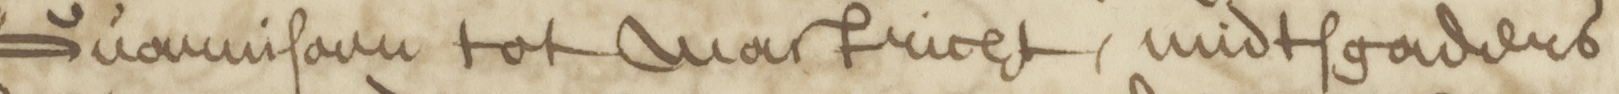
Guarnisoen tot Mastricht, midtsgaders
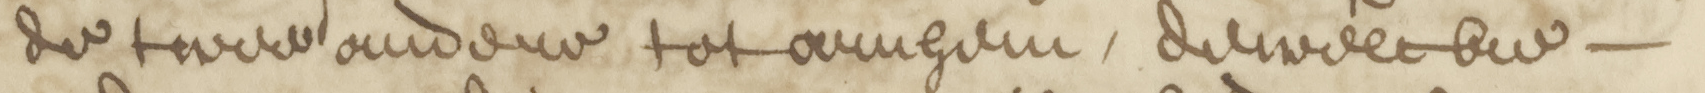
de twee andere tot arnhem, dewelcke —
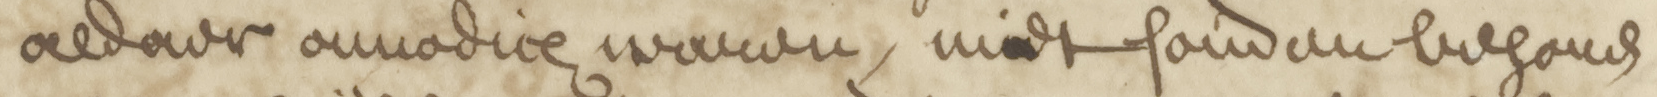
aldaer onnodich waren, niet souden behoren
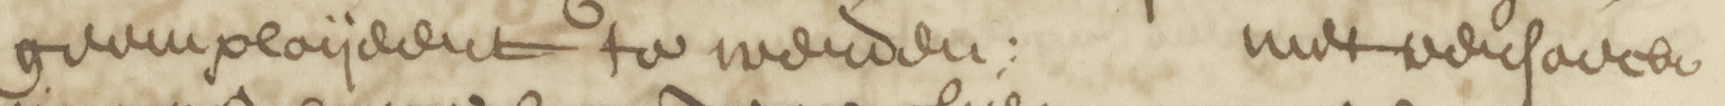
geemploijeert te werden; met versoeck
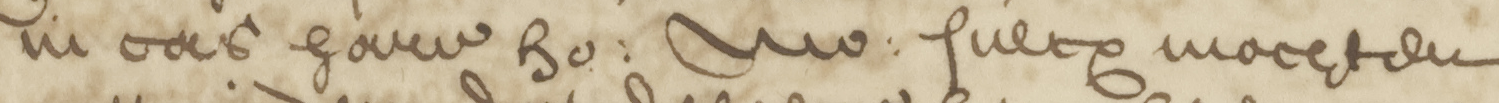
in cas hare ho:Mo sulcx mochten
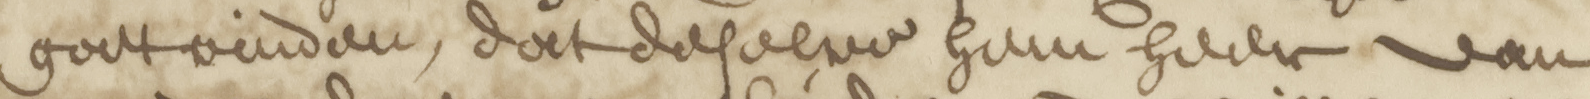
goetvinden, dat deselve hem heer van
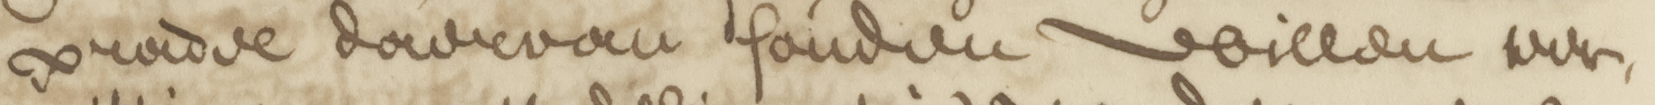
pradel daervan souden willen ver,
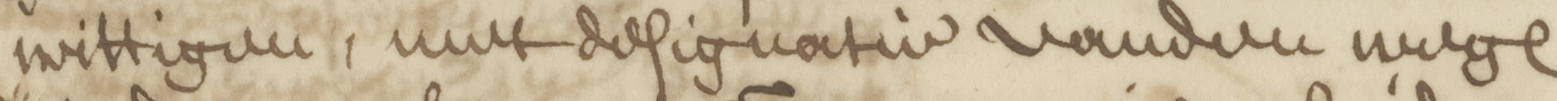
wittigen, met designatie vanden wegh
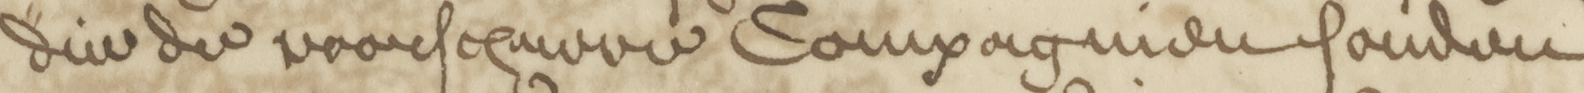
die de voorschreve Compagnien souden
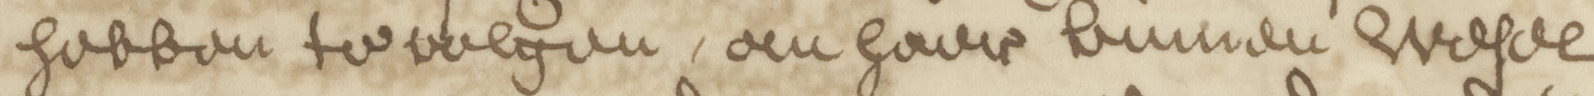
hebben te volgen, om haer binnen Wesel
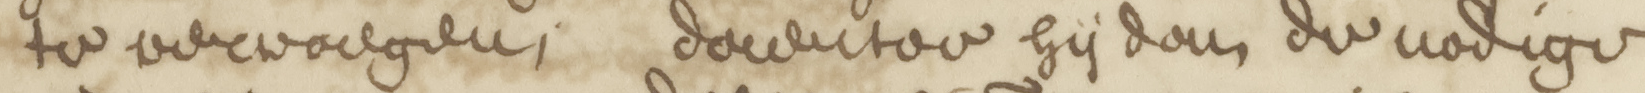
te vervoegen; daertoe hij dan de nodige
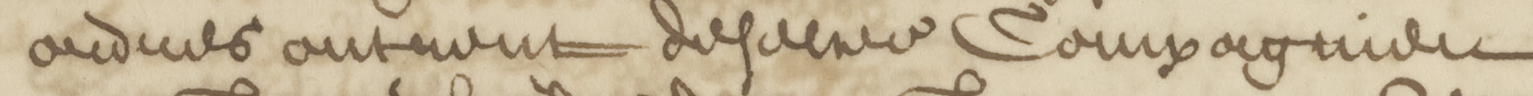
ordres ontrent deselve Compagnien
